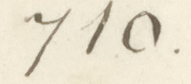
710.
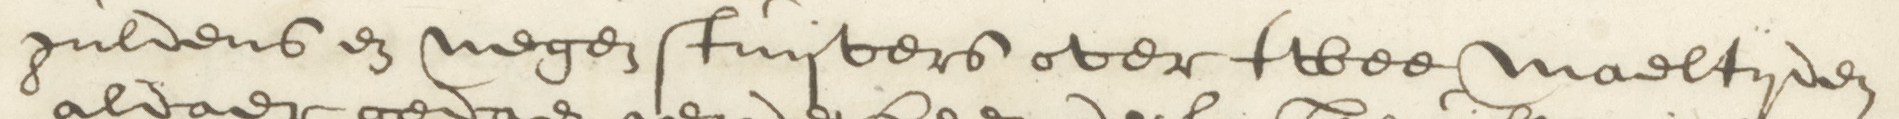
guldens en negen stuijvers over twee maeltijden
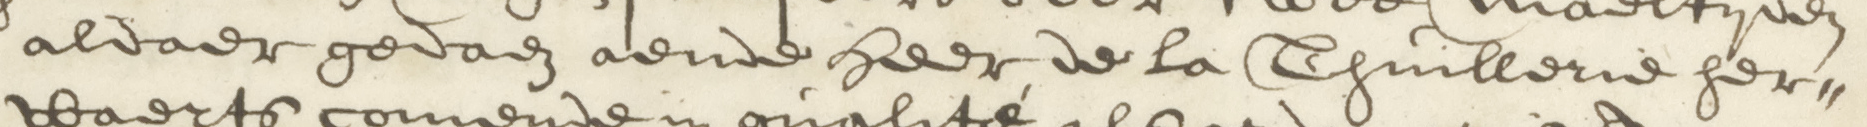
aldaer gedaen aende heer de la Thuillerie her„
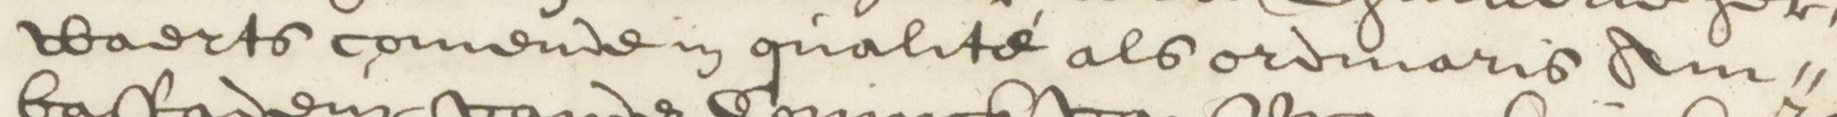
waerts comende in qualité als ordinaris Am„
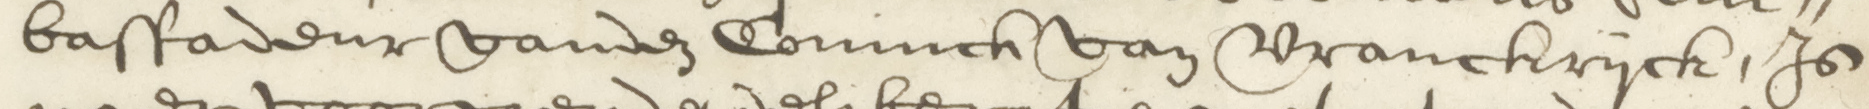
bassadeur vanden Coninck van Vranckrijck, Is
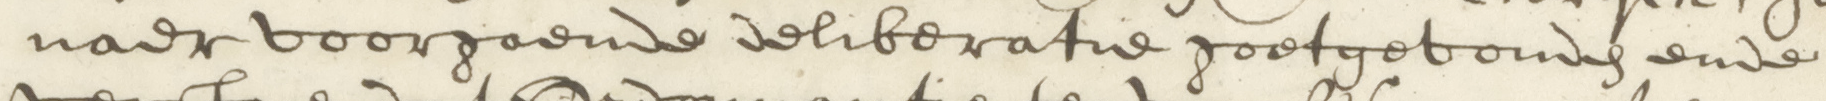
naer voorgaende deliberatie goetgevonden ende
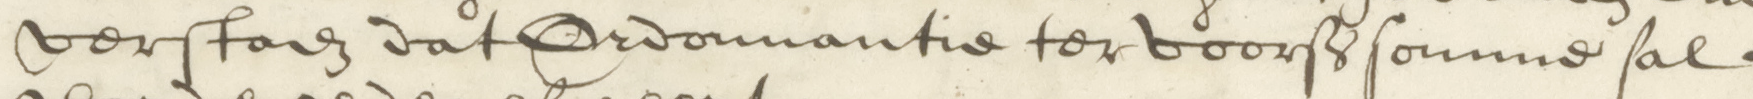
verstaen dat Ordonnantie ter voors somme sal
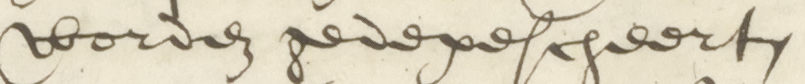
worden gedepescheert.
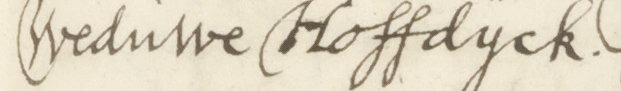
Weduwe Hoffdijck.
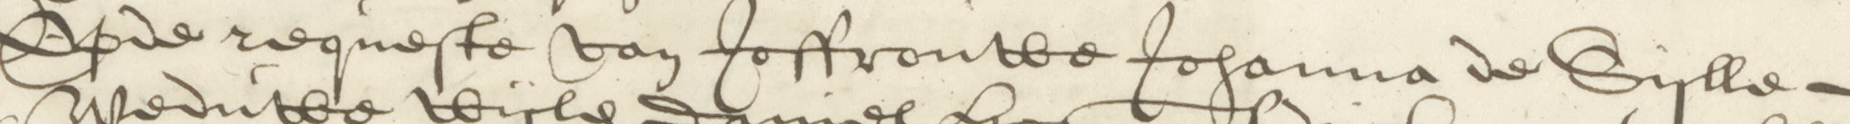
Opde requeste van Joffrouwe Johanna de Sijlle-
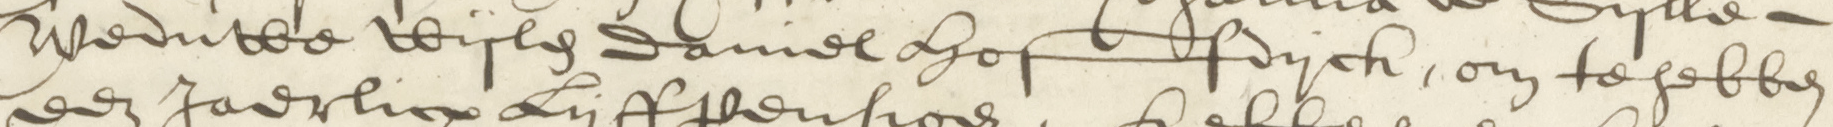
Weduwe wijlen Daniel Hoffdijck, om te hebben
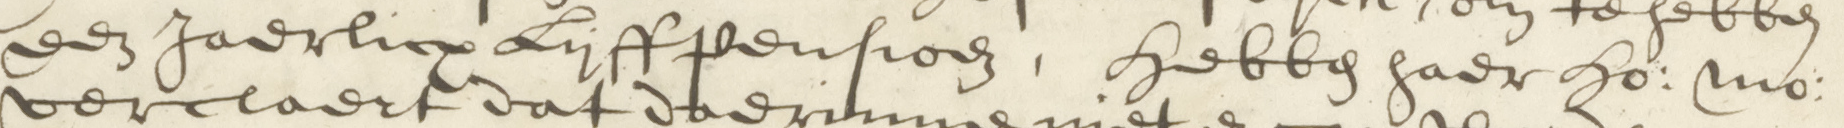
een Jaerlicx Lijffpensioen, hebben haer Ho:Mo:
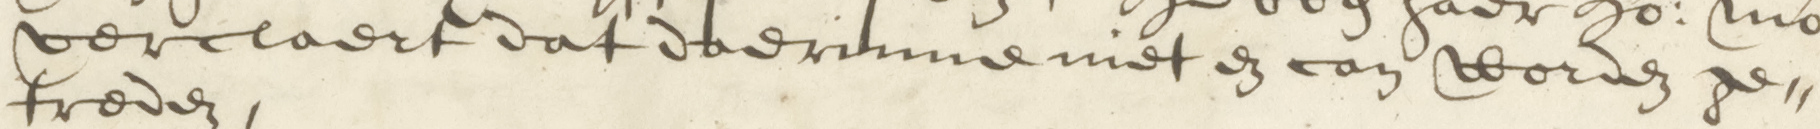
verclaert dat daerinne niet en can worden ge„
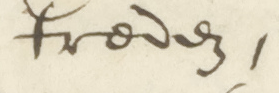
treden.
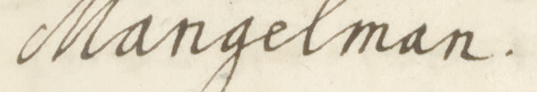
Mangelman.
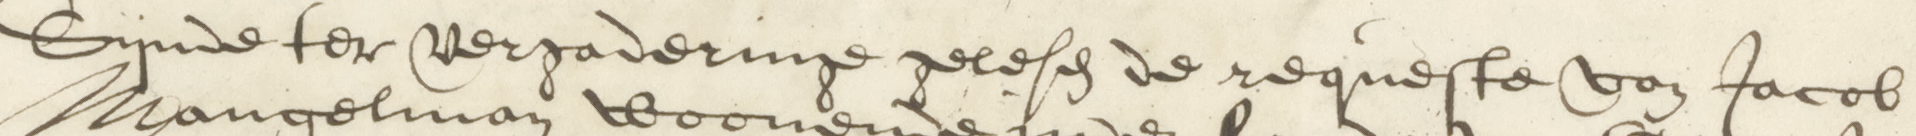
Sijnde ter Vergaderinge gelesen de requeste van Jacob
